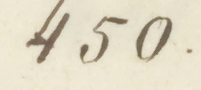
450.
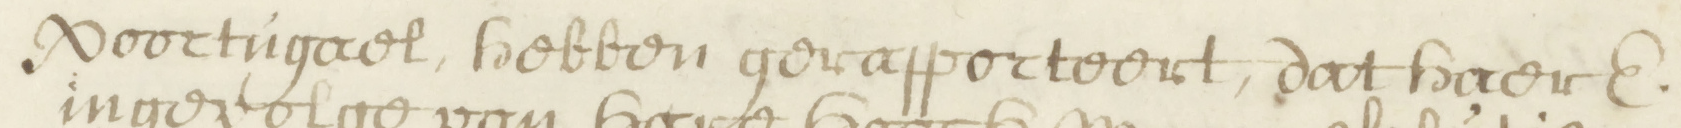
Poortugael, hebben gerapporteert, dat haere E.
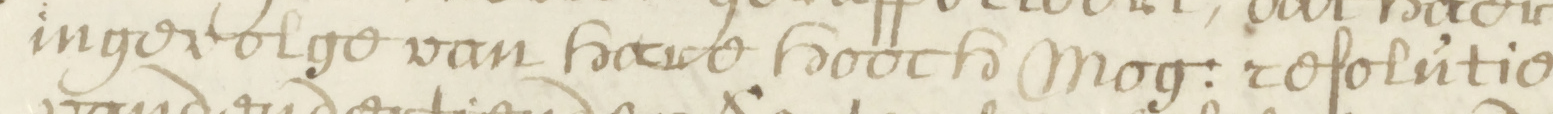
ingevolge van hare Hooch Mog: resolutie
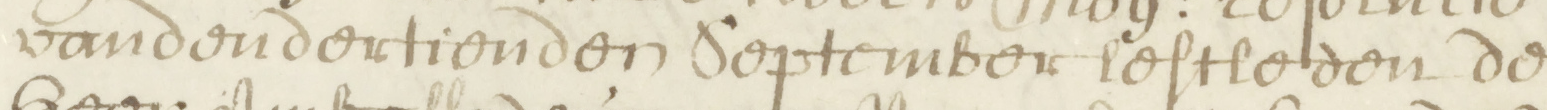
vanden dertienden September lestleden de
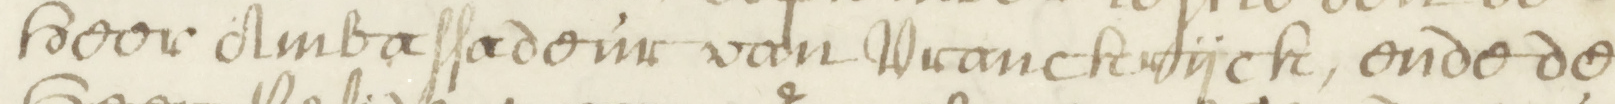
heer Ambassadeur van Vranckrijck, ende de
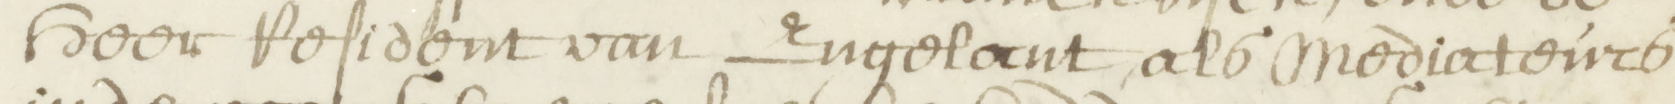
heer Resident van Engelant, als Mediateurs
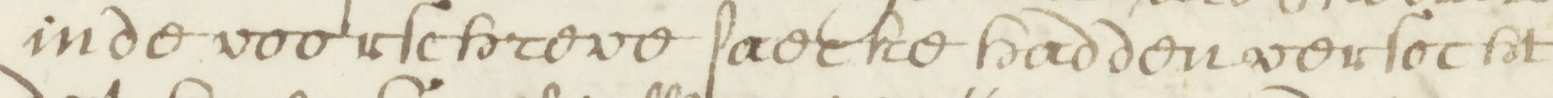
in de voorschreve saecke hadden versocht
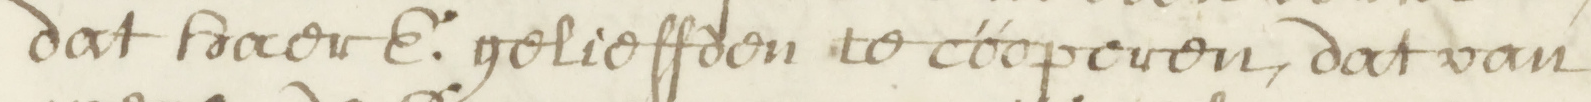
dat haer E. gelieffden te cöoperen, dat van
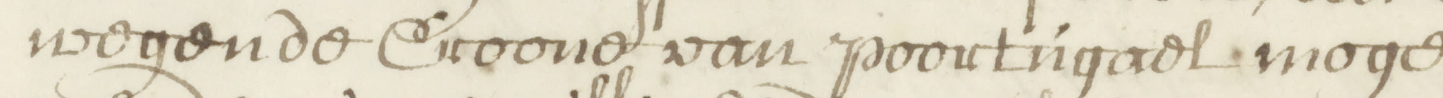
wegen de Croone van poortugael moge
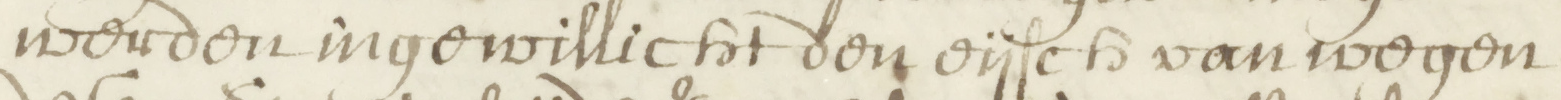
werden ingewillicht den eijsch van wegen
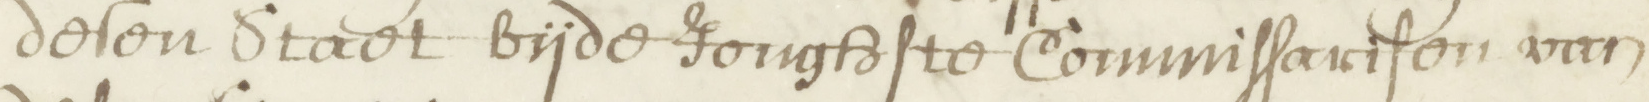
desen Staet bijde Jonghste Commissarisen van
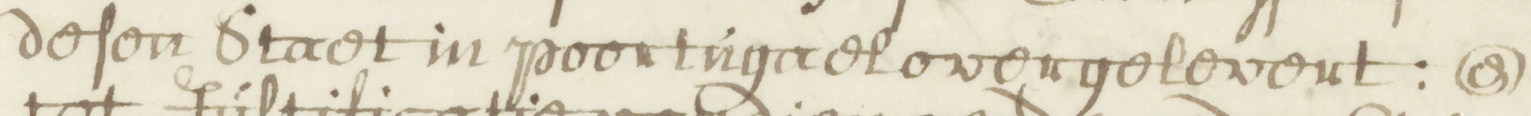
desen Staet in poortugael overgelevert: &
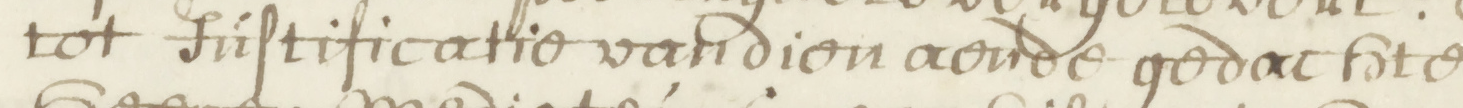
tot Justificatie van dien aende gedachte
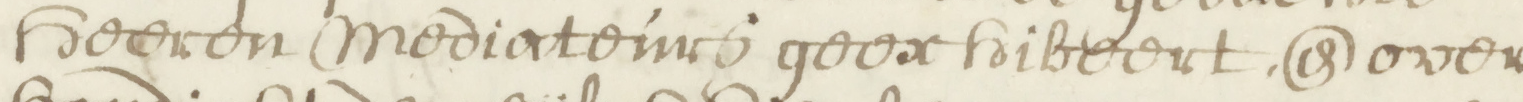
Heeren Mediateurs geexhibeert, & over
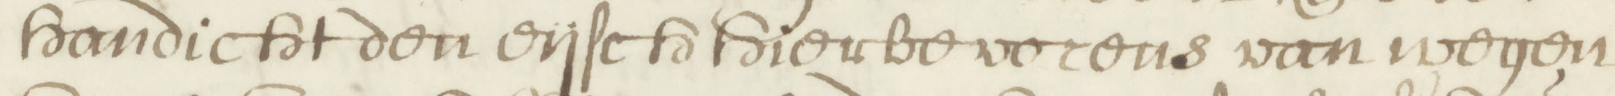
handicht den eijsch hierbevorens van wegen
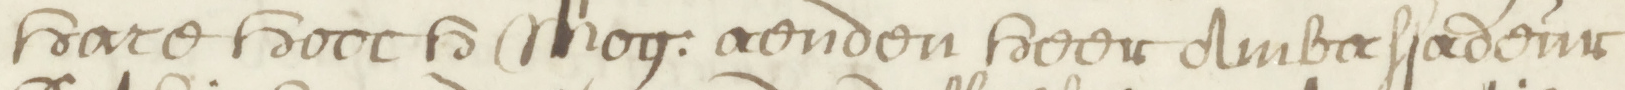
hare Hooch Mog: aenden heer Ambassadeur
